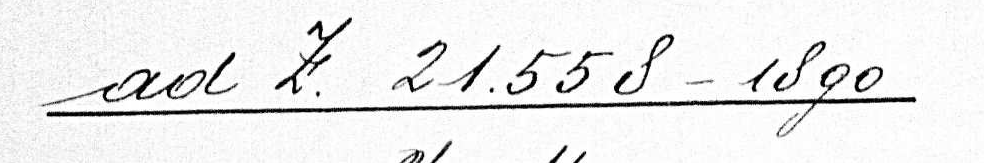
ad Z. 21.558-1890
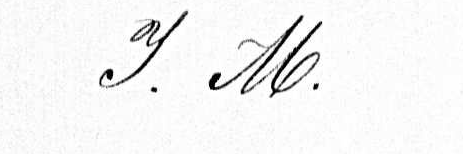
J. M.
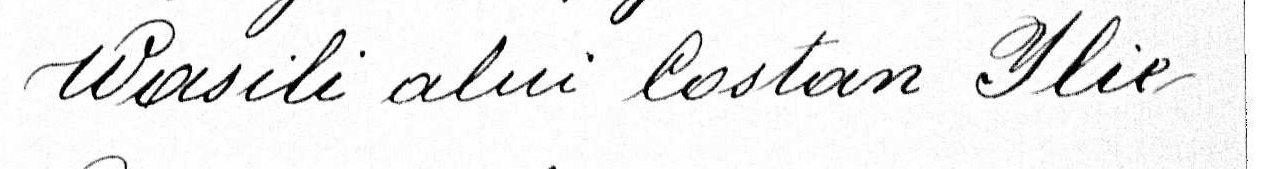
Wasili alui Costan Jlie
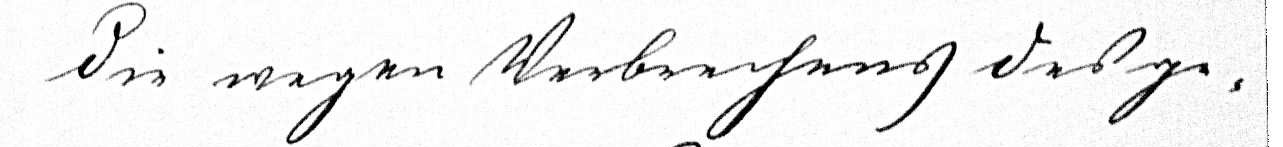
die wegen Verbrechens des ge¬
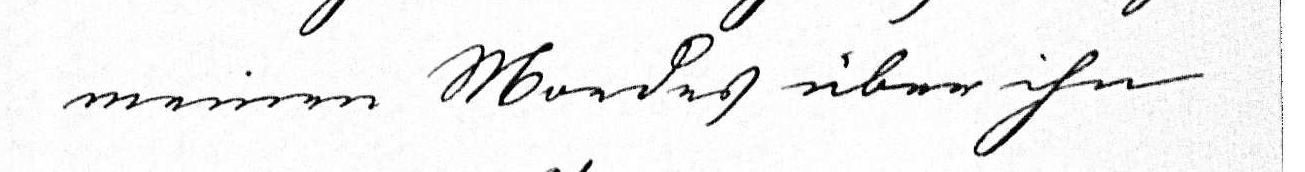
meinen Mordes über ihn
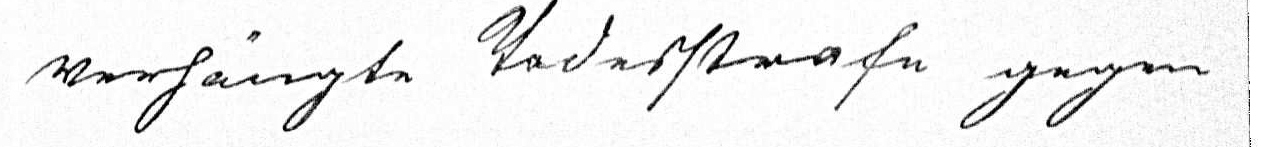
verhängte Todesstrafe gegen
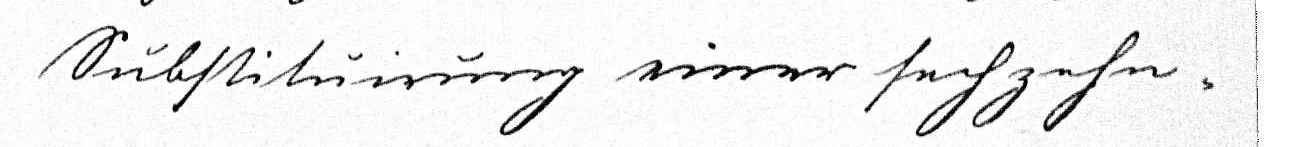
Substituirung einer sechzehn¬
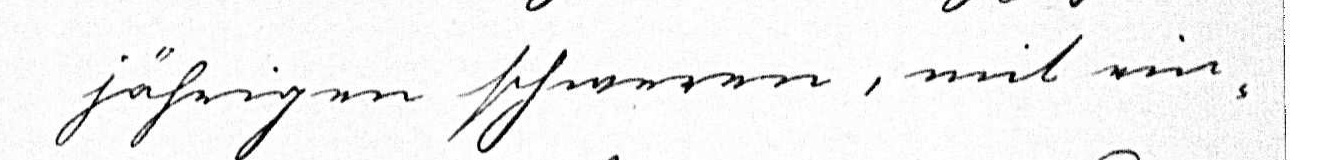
jährigen schweren, mit ein¬
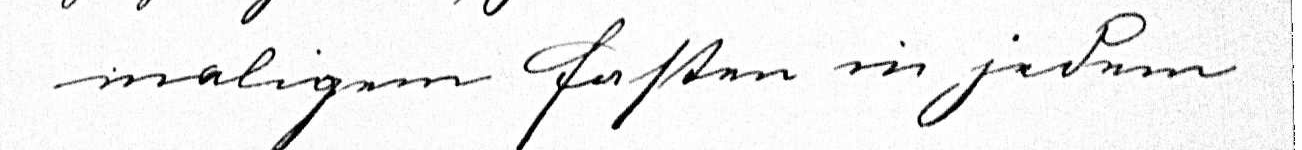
maligem Fasten in jedem
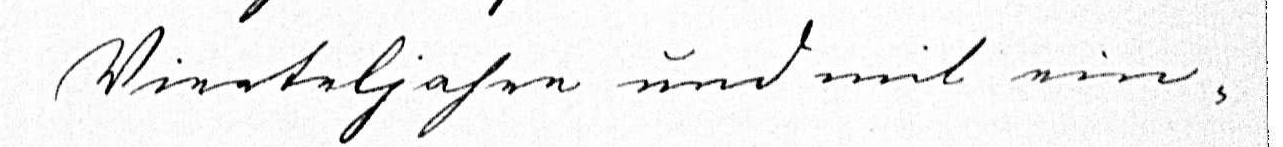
Vierteljahre und mit ein¬
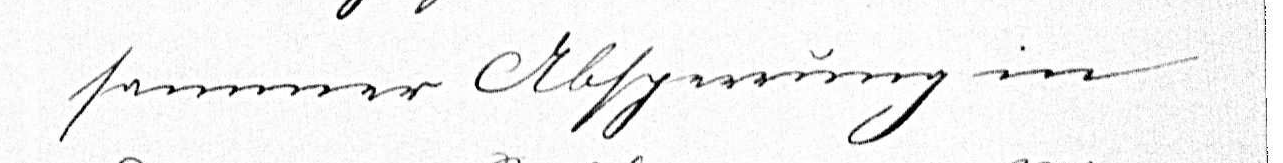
sammer Absperrung in
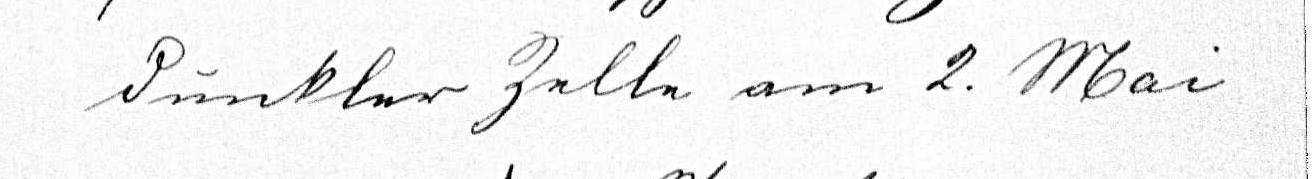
dunkler Zelle am 2. Mai
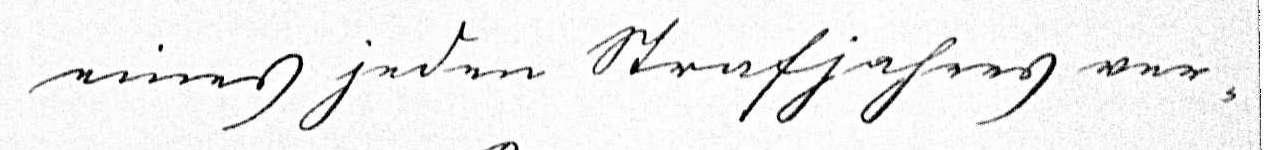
eines jeden Strafjahres ver¬
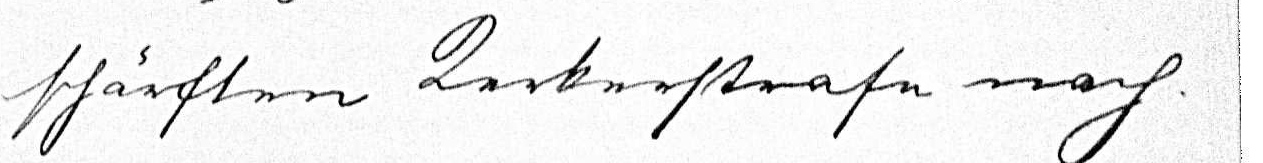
schärften Kerkerstrafe nach.
